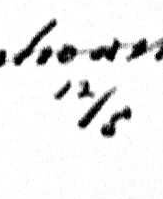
12/5
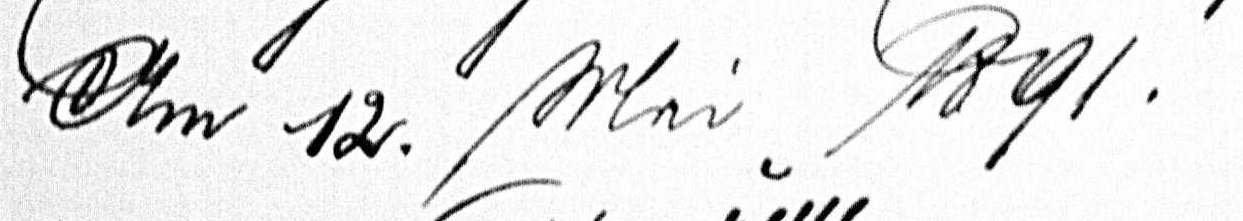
Am 12. Mai 1891
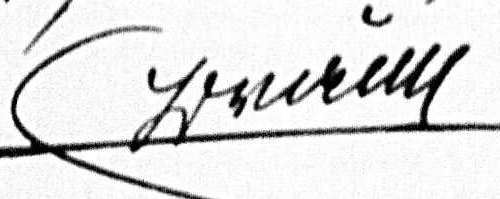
Wraun
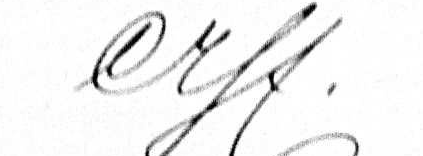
AE
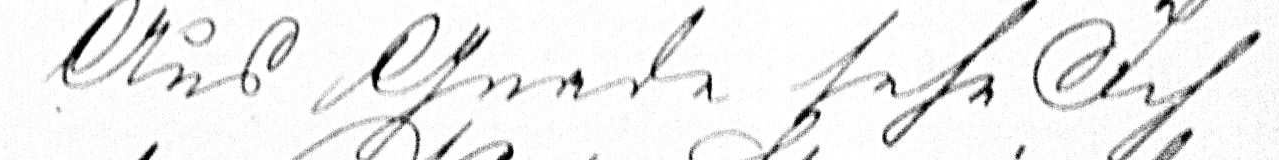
Aus Gnade sehe ich
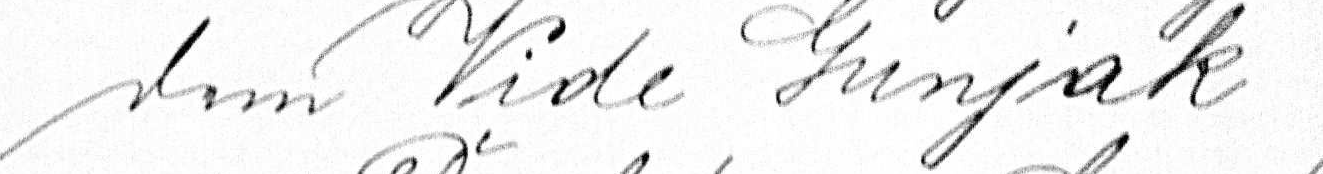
dem Video Gunjak
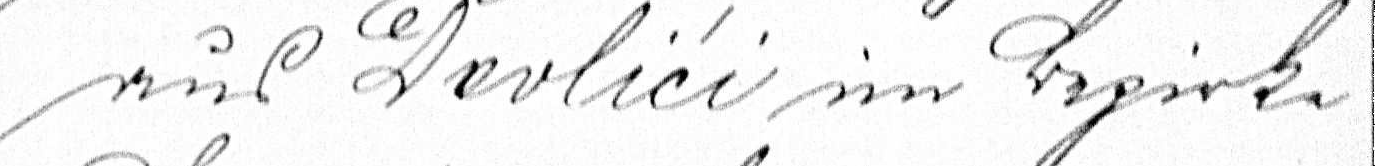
aus Ďovlići im Bezirke
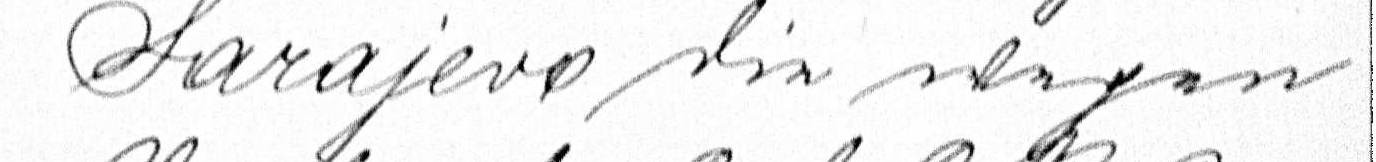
Sarajevo die wegen
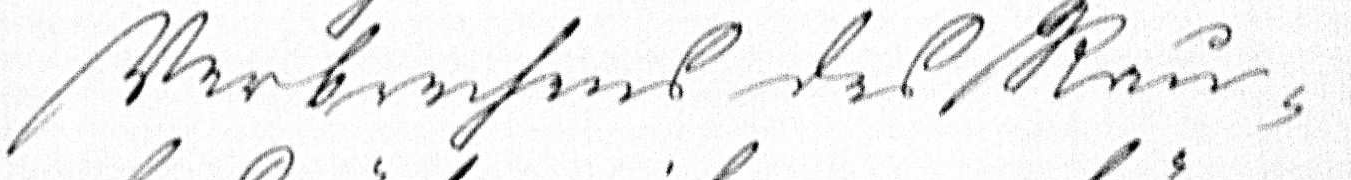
Verbrechens des Rau¬
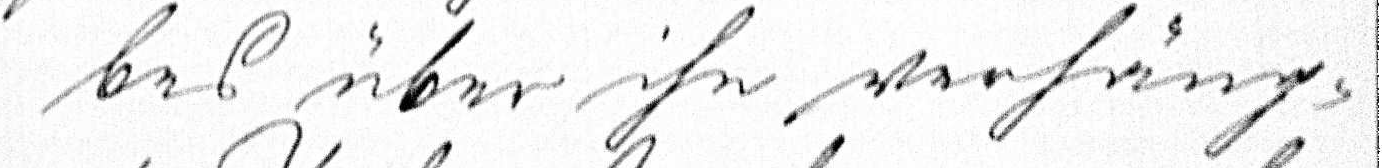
bes über ihn verhäng¬
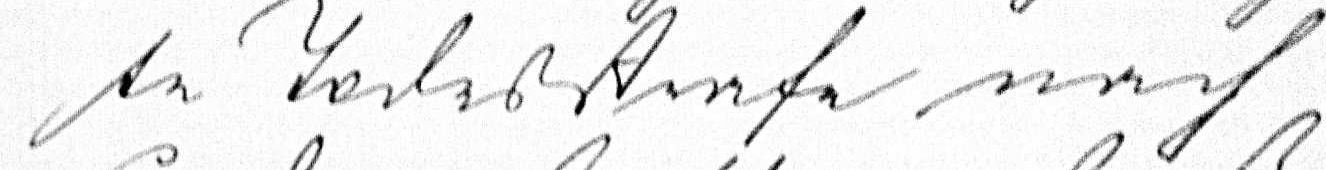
te Todesstrafe nach
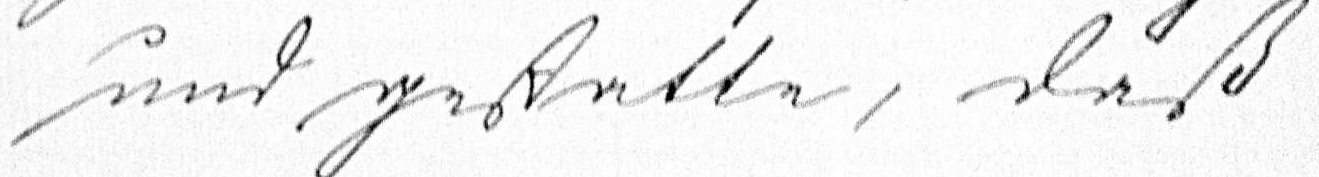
und gestatte, daß
